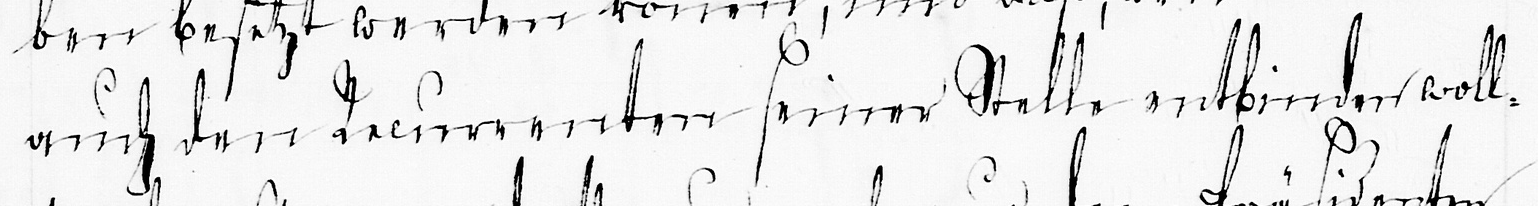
auch den Recurrenten seiner Stelle entbinden woll¬
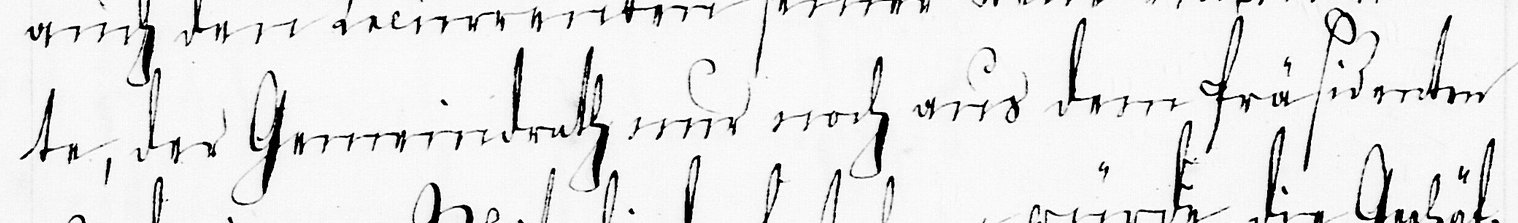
te, der Gemeindrath nur noch aus dem Präsidenten
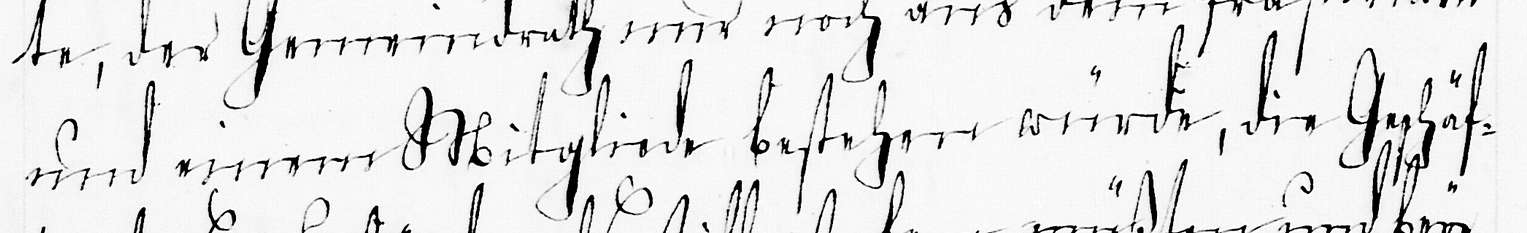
und einem Mitgliede bestehen würde, die Geschäf¬
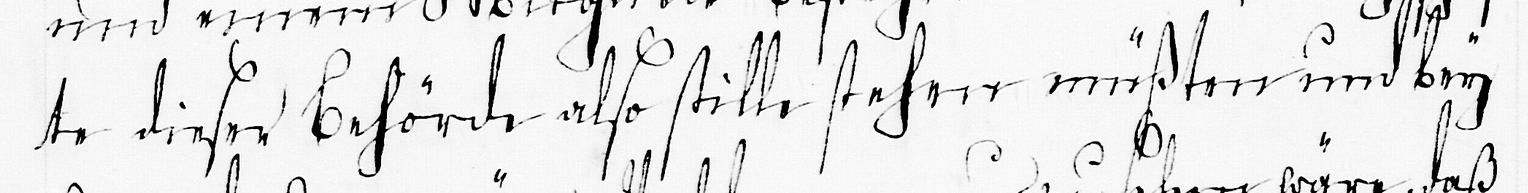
te dieser Behörde also stille stehen müßten und bey
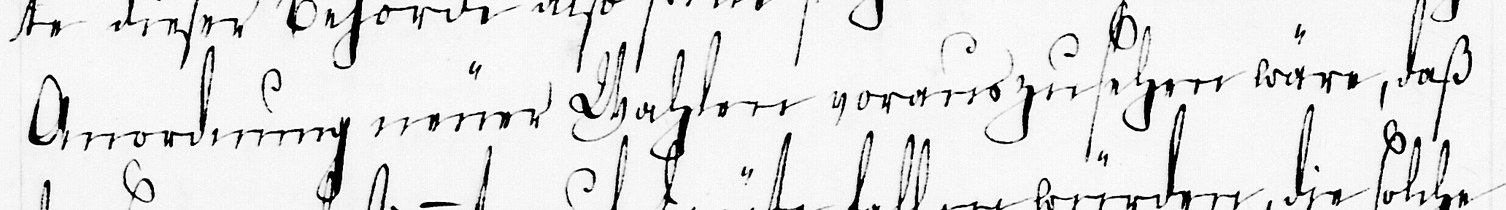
Anordnung neuer Wahlen vorauszusehen wäre, daß
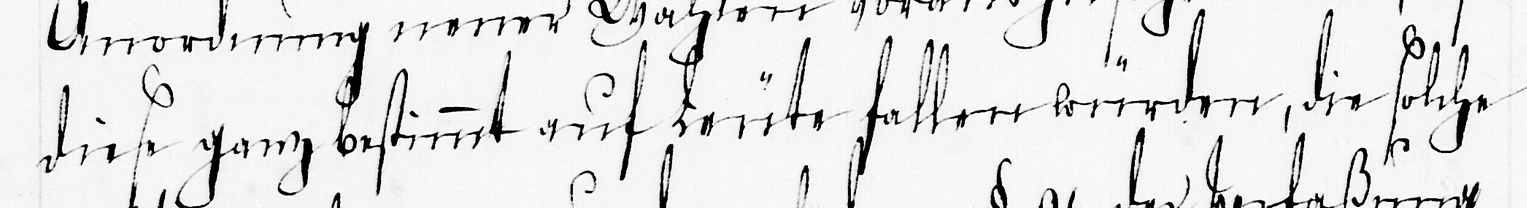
diese ganz bestimmt auf Leute fallen würden, die solche
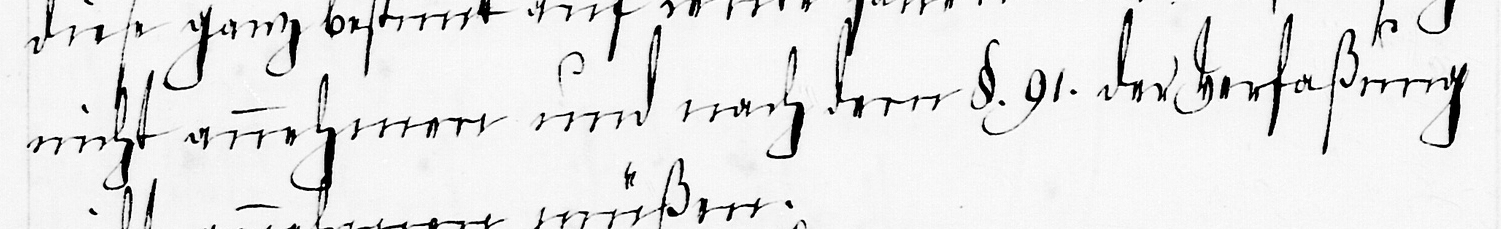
nicht annehmen und nach dem §. 91. der Verfaßung
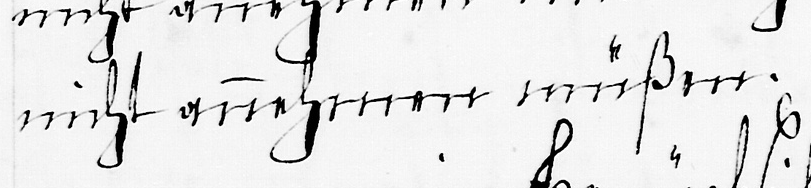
nicht annehmen müßen.
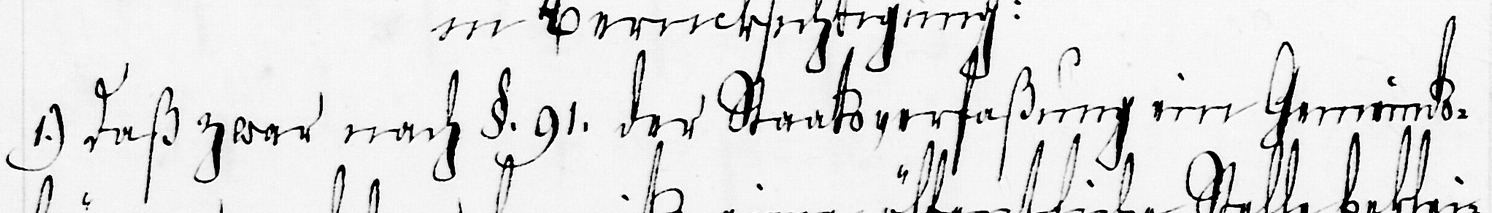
1.) Daß zwar nach §. 91. der Staatsverfaßung ein Gemeinds¬
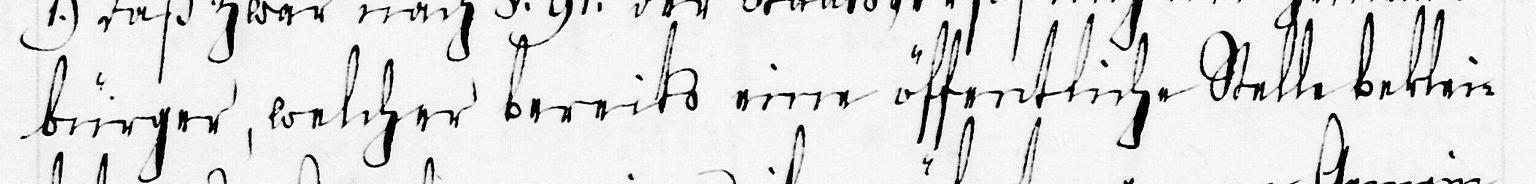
bürger, welcher bereits eine öffentliche Stelle beklei¬
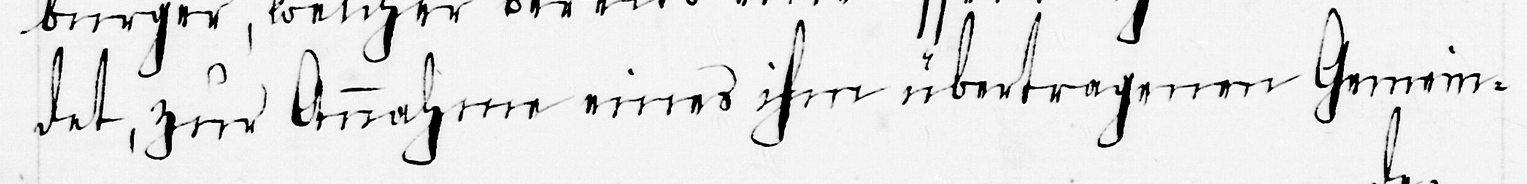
det, zur Annahme eines ihm übertragenen Gemein-
